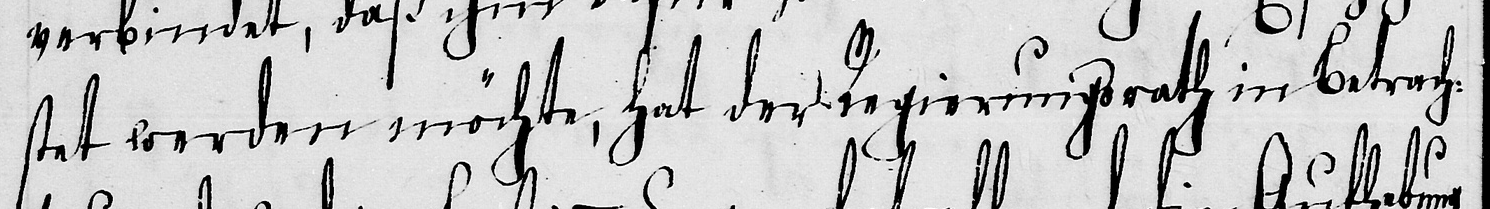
stet werden möchte, hat der Regierungsrath in Betrach¬
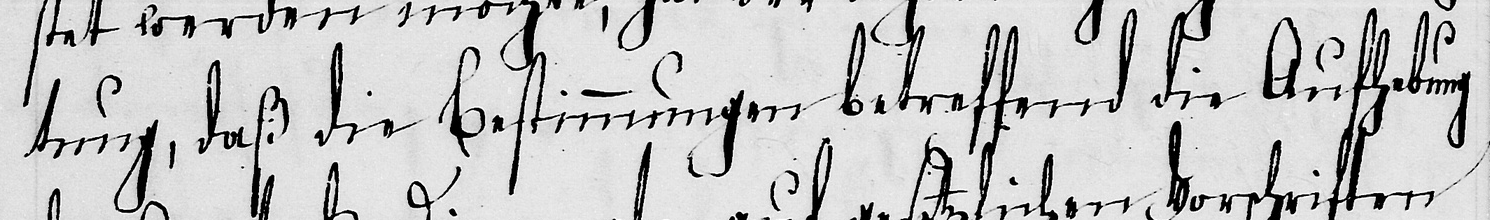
tung, daß die Bestimmungen betreffend die Aufhebung
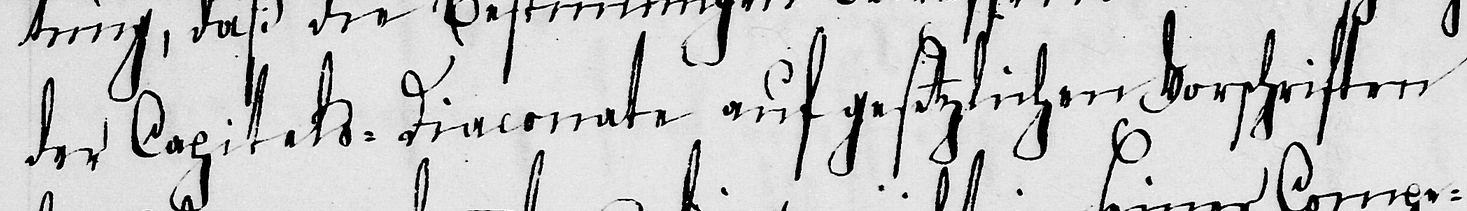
der Capitals-Diaconate auf gesetzlichen Vorschriften
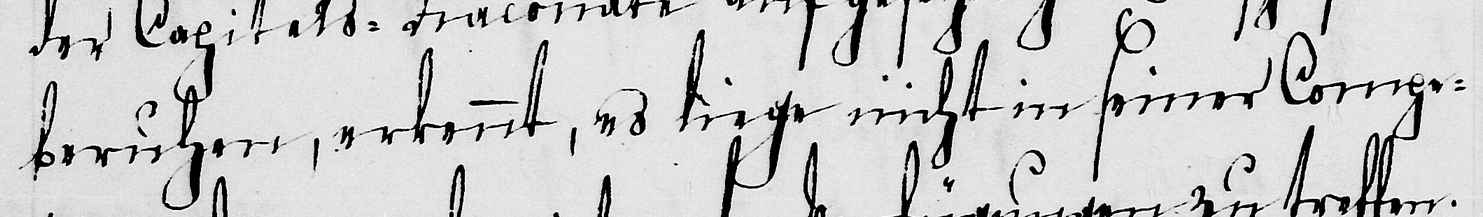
beruhen, erkannt, es liege nicht in seiner Compe¬
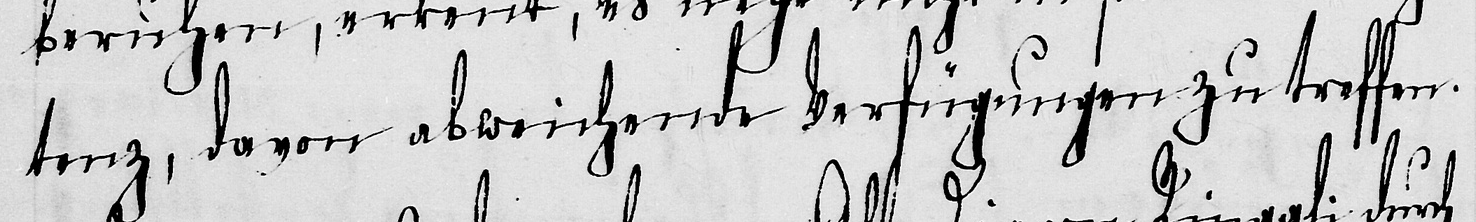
tenz, davon abweichende Verfügungen zu treffen.
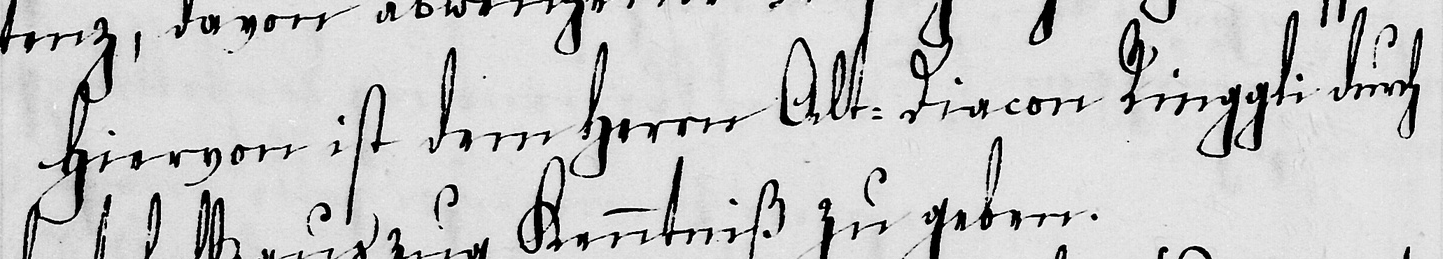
Hiervon ist dem Herrn Alt-Diacon Ringgli du¬
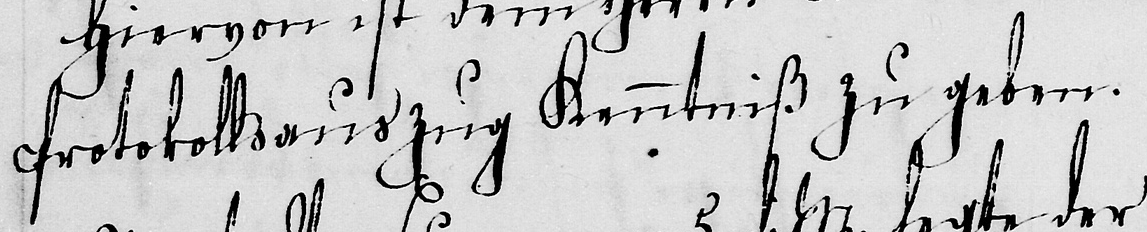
Protokollsauszug Kenntniß zu geben.
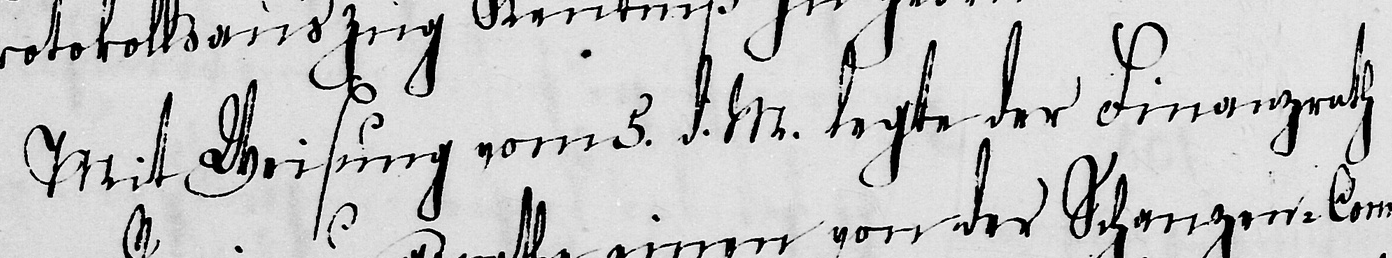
Mit Weisung vom 5. d. M. legte der Finanzrath
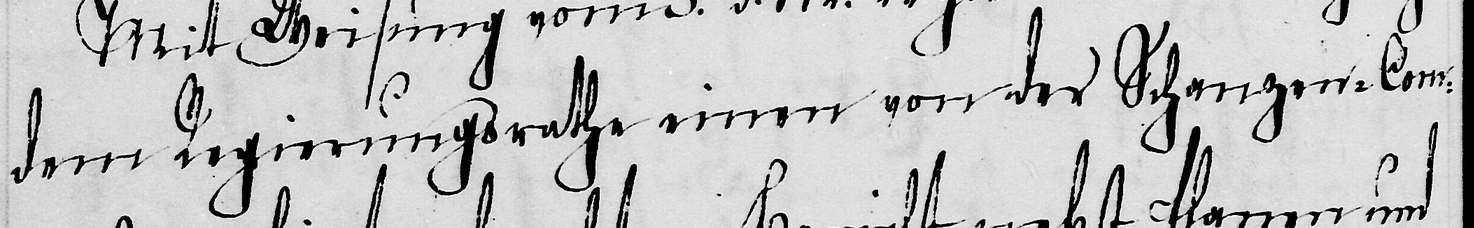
dem Regierungsrathe einen von der Schanzen-Com¬
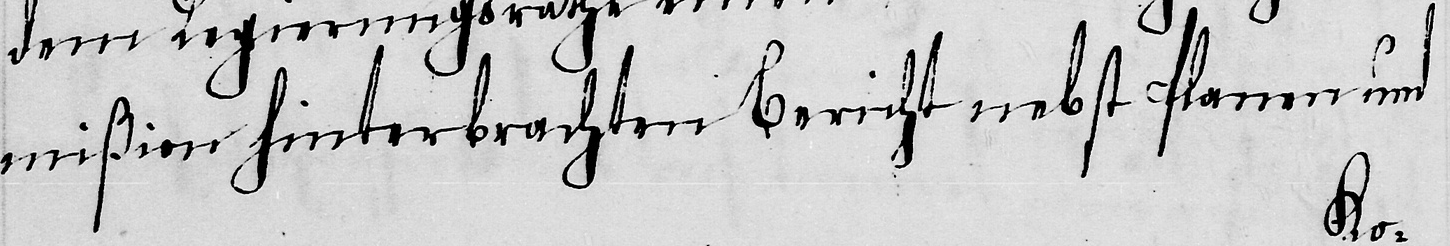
mißion hinterbrachten Bericht nebst Planen und
